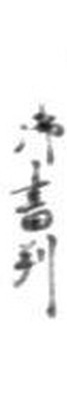御書判
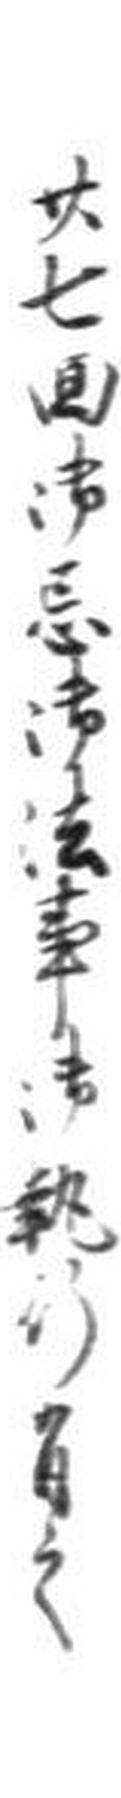廿七回御忌御法事御執行有之

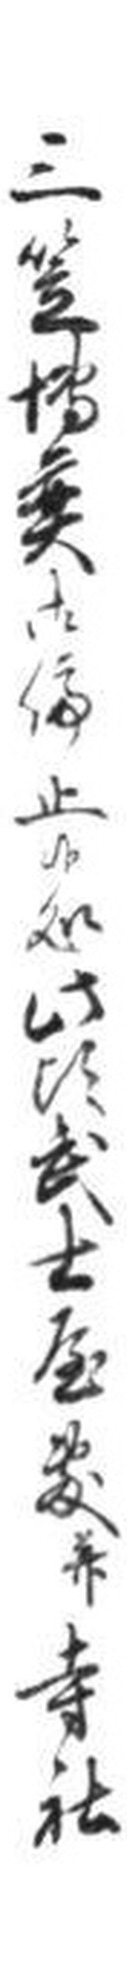三笠博奕御停止候処此頃武士屋敷并寺社
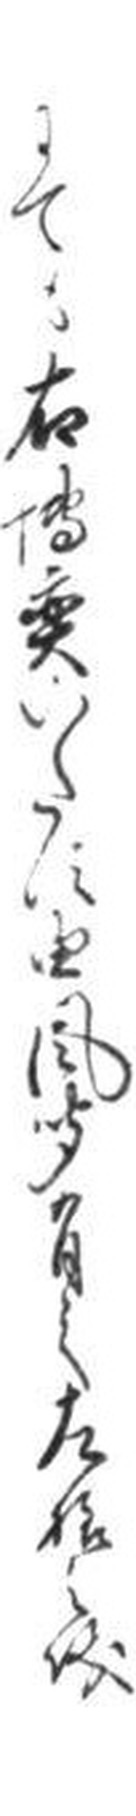にても右博奕いたす由風聞有之左様之儀
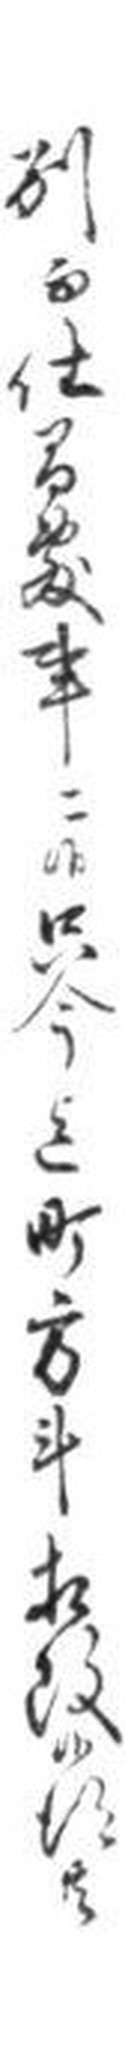別而仕間敷事ニ候只今迄町方斗相改候得共
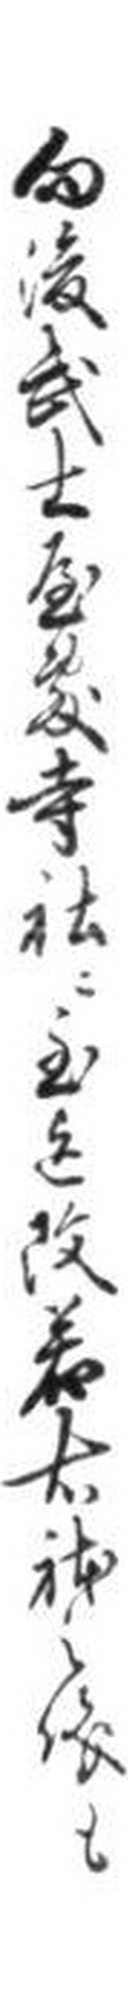向後武士屋敷寺社ニ至迄改若右体之儀も
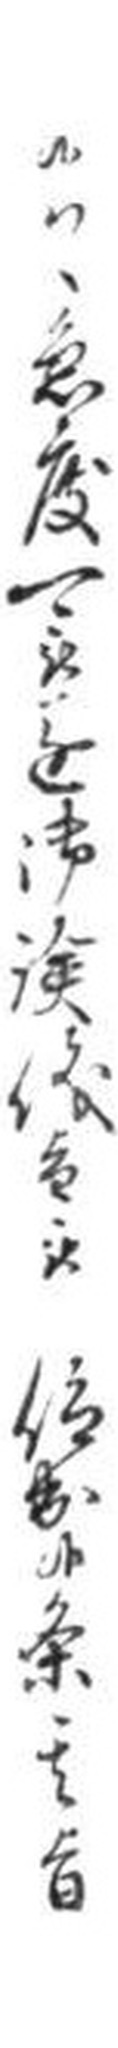候ハヽ急度可被遂御譣儀旨被仰出候条其旨
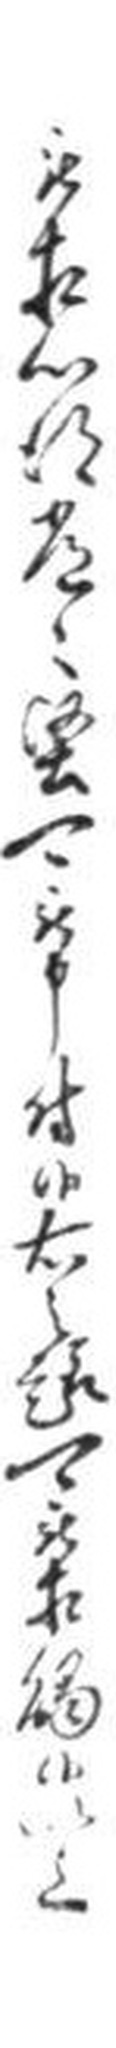被相心得常々堅可被申付候右之趣可被相触候以上
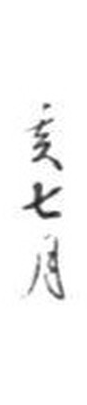亥七月
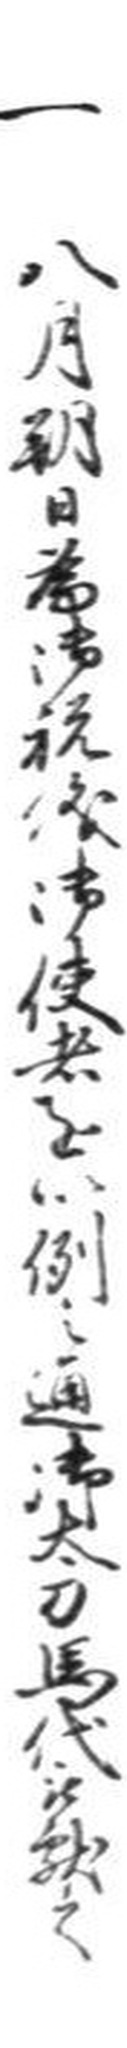一八月朔日為御祝儀御使者を以例之通御太刀馬代被献之
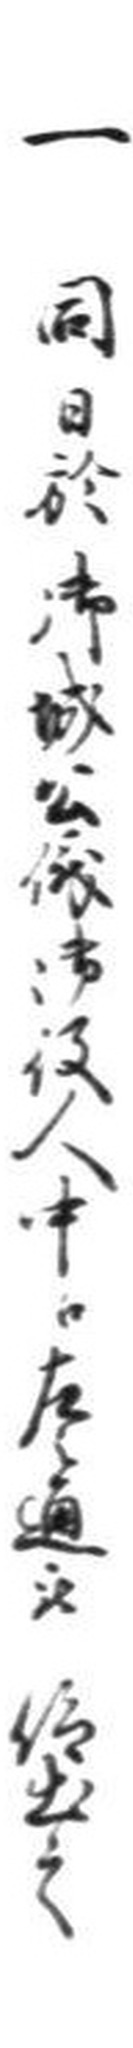一同日於御城公儀御役人中江左之通被仰出之
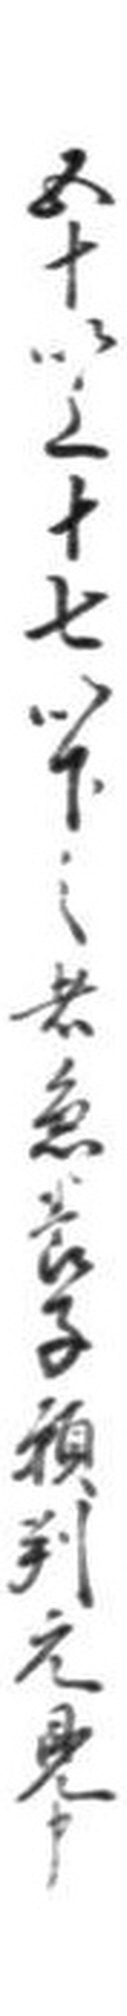五十以上十七以下之者急養子願判元見申
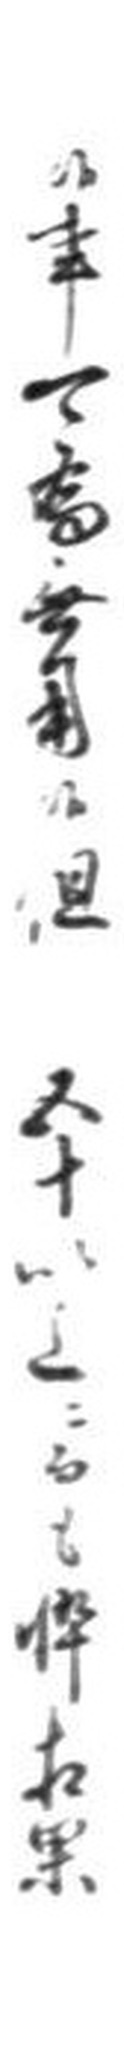候事可為無用候但五十以上ニ而も忰相果
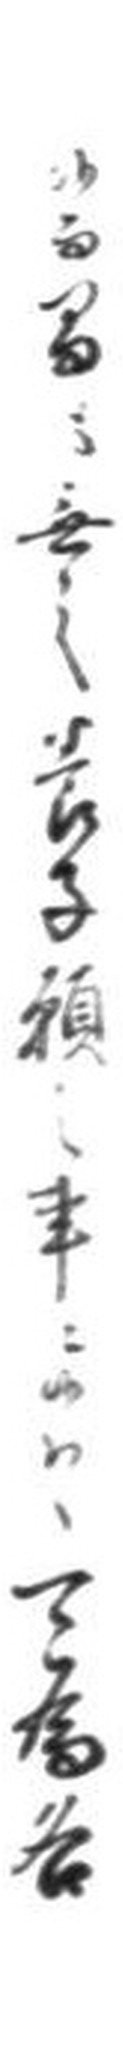候而間も無之養子願之事ニ候ハヽ可為各
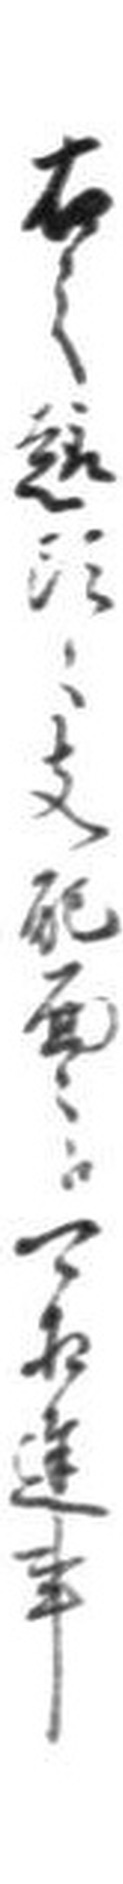右之趣頭々支配面々江可相達事
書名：家譜 三十三 吉邦公 享保四年
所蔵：福井県文書館 Fukui Prefectural Archives
